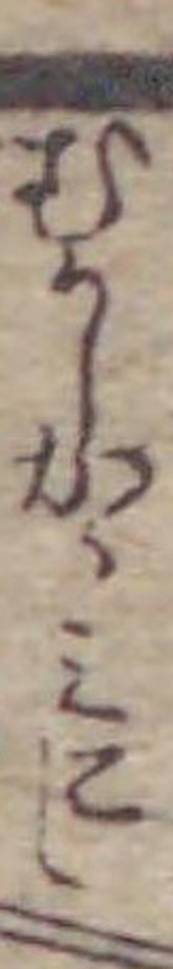むかしからみこし
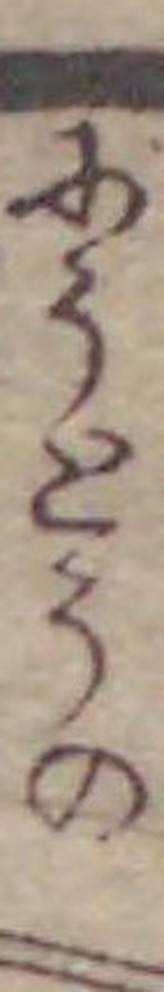にうとうの
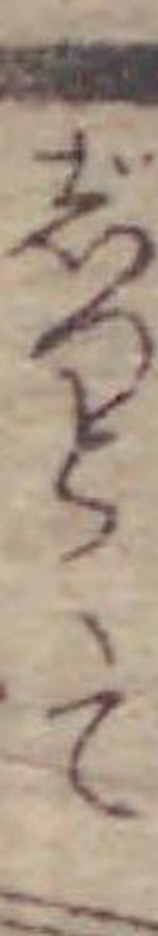じつとくて
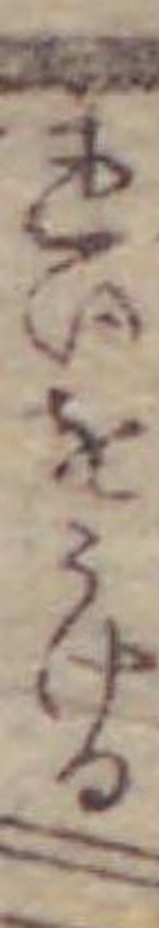れいをうける
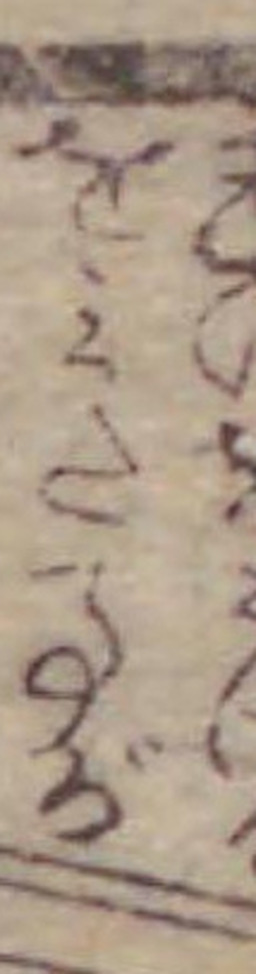をみた事が
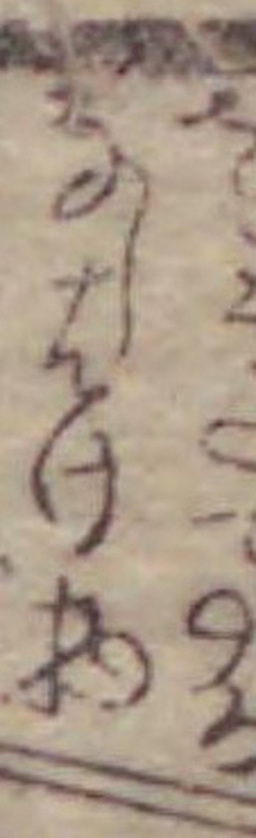なしはけ物
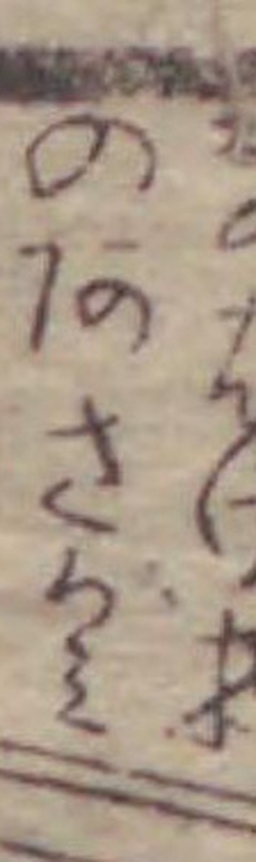のあさかみ
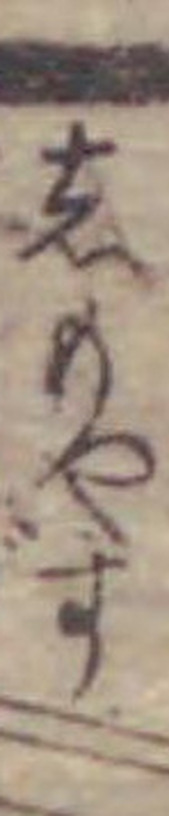しもやす
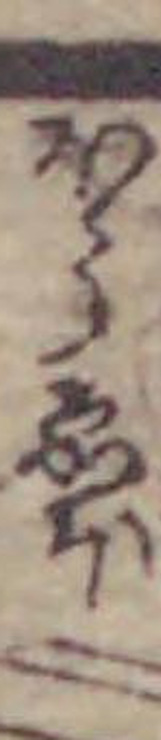ほうゑぼ
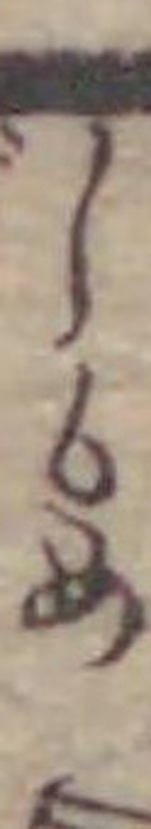しもめ
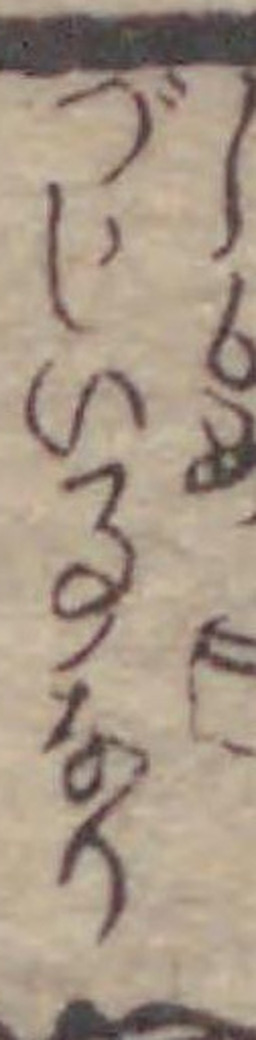づらしい事なり
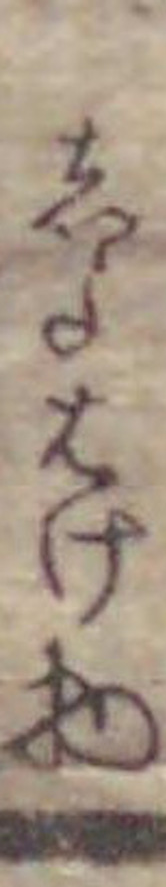しよはけ物
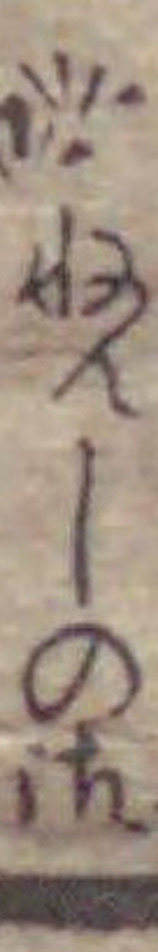ねんしの御
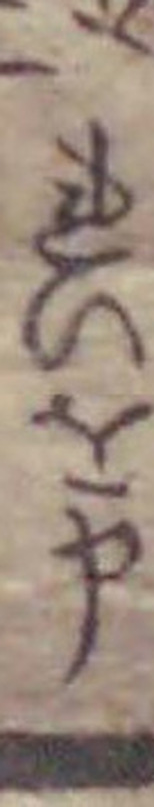れいを申
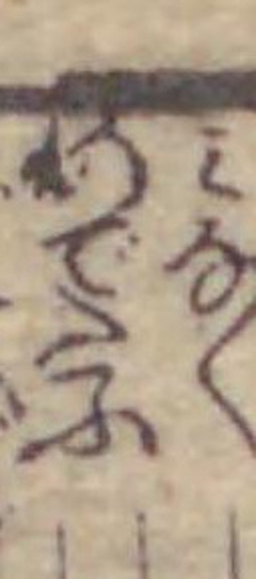めだたふ
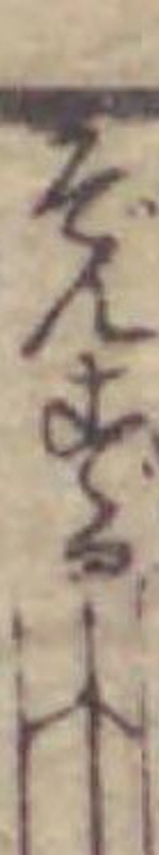ぞんずる
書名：化物仲間破 : 2巻
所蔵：国立国会図書館 National Diet Library, JAPAN
